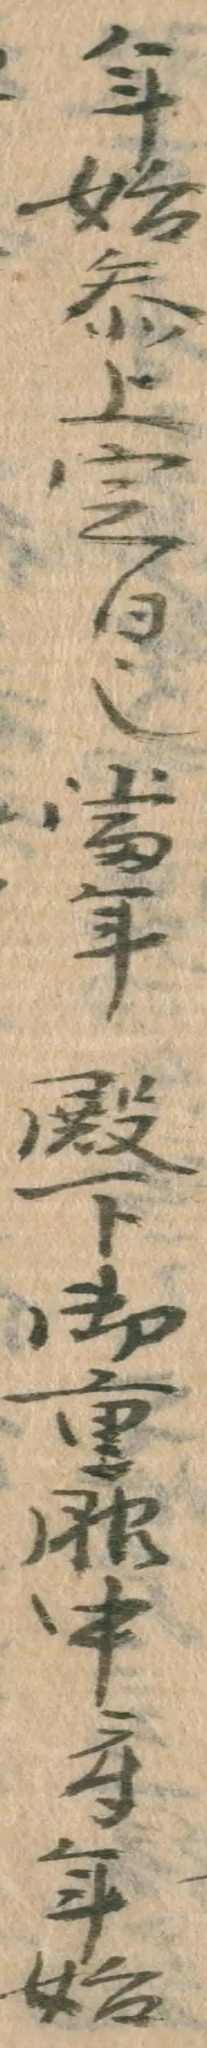年始参上定日也當年殿下御重服中ニ付年始
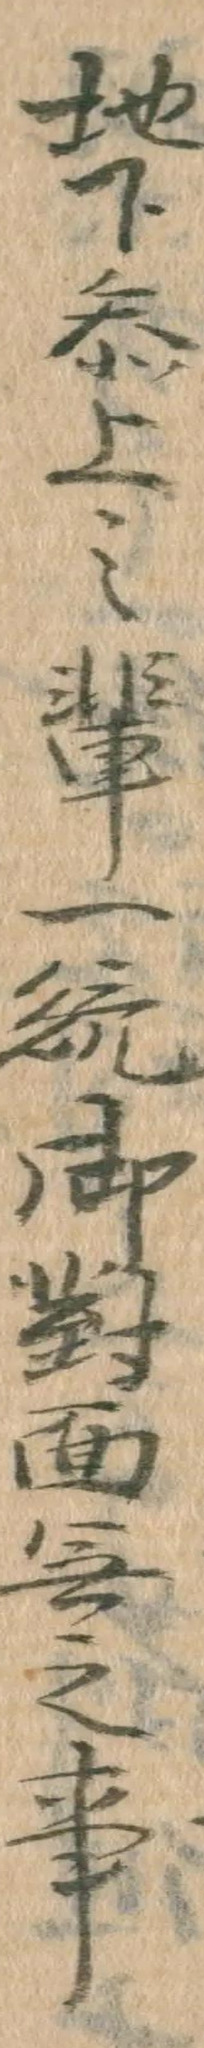地下参上之輩一統御對面無之事
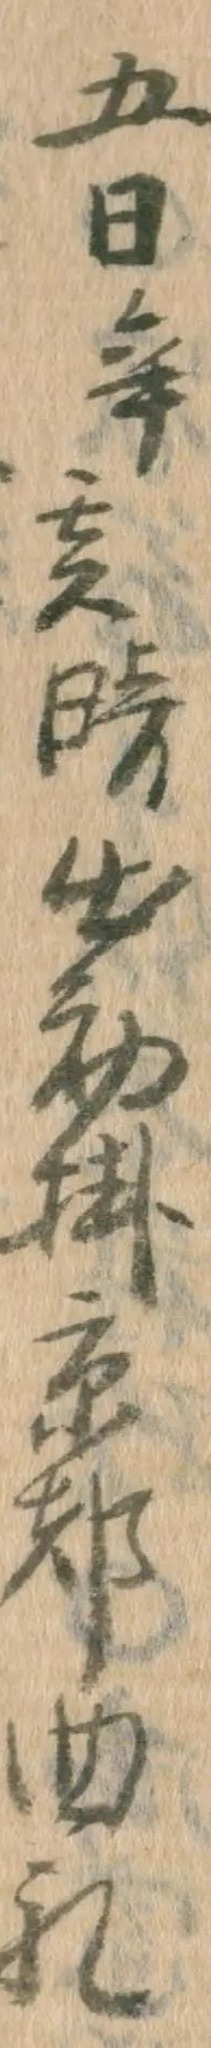五日辛亥晴出勤掛京都回礼
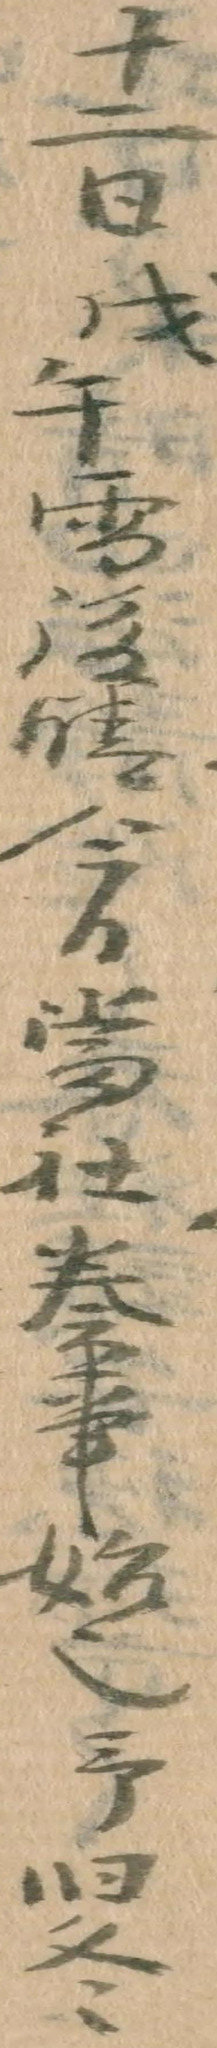十二日戊午雪後晴今日當社奏事始也予旧冬
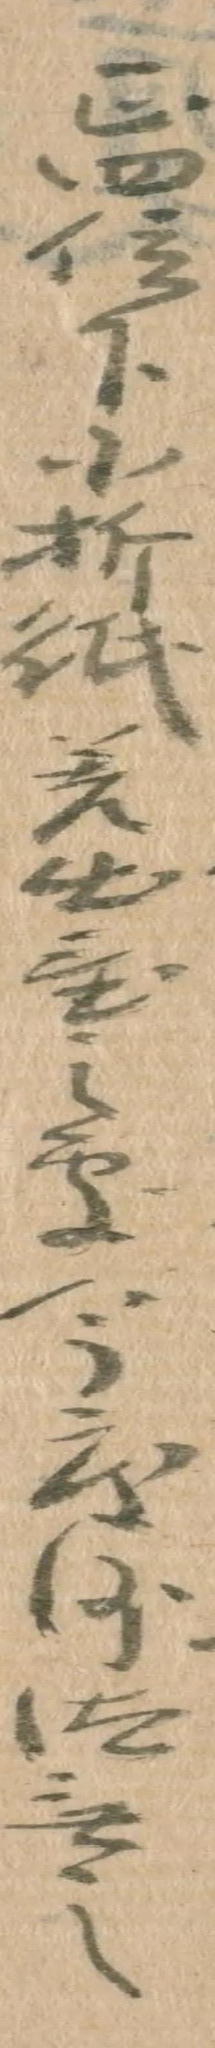正四位下小折紙差出置之處今度状無也
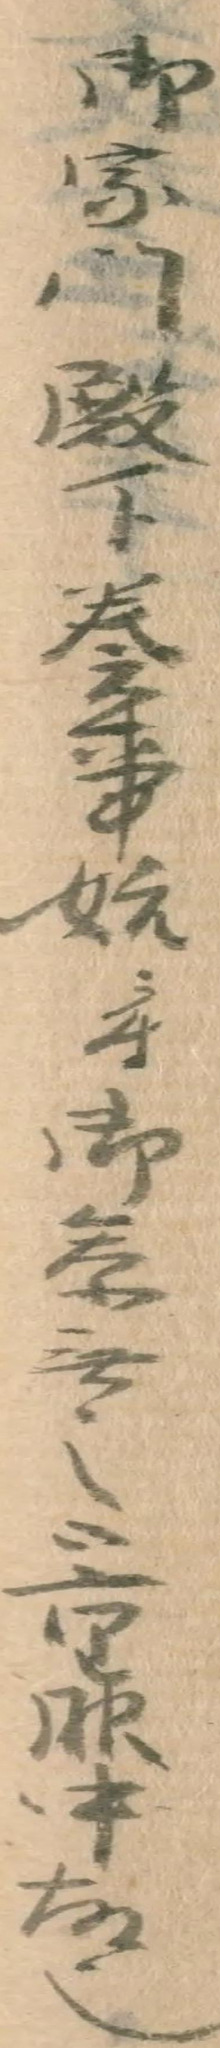御家門殿下奏事始ニ付御参無之御重服中故也
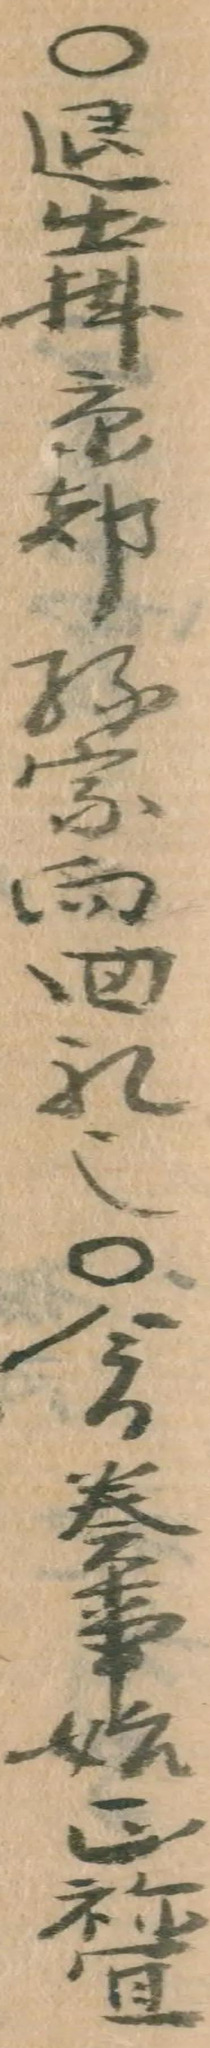○退出掛京都縁家而回礼也○今日奏事始正称宜
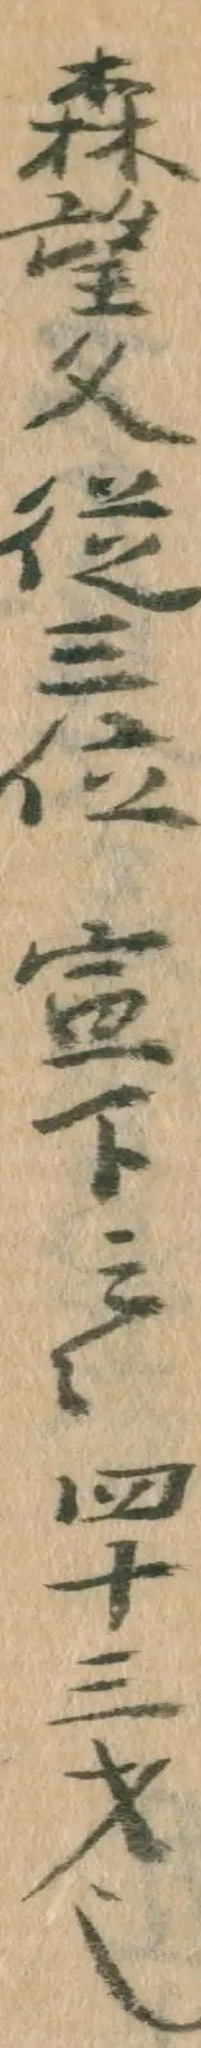森望久従三位宣下云々四十三才也
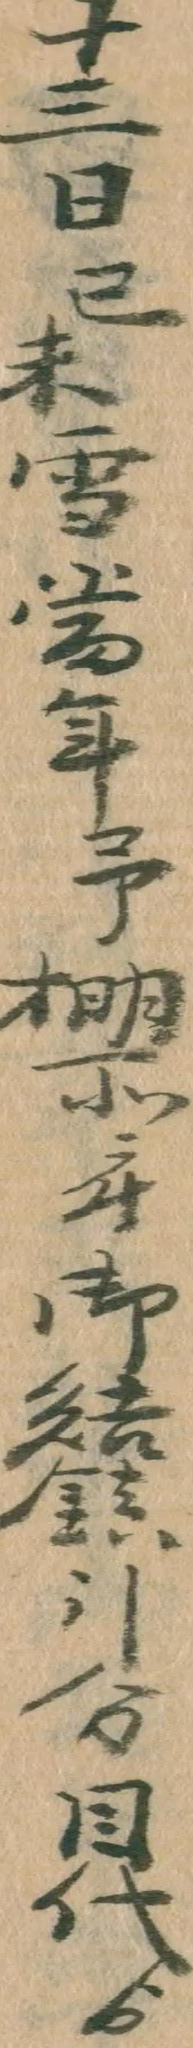十三日己未雪當年予棚所ニ付御結鎮引分目代ゟ
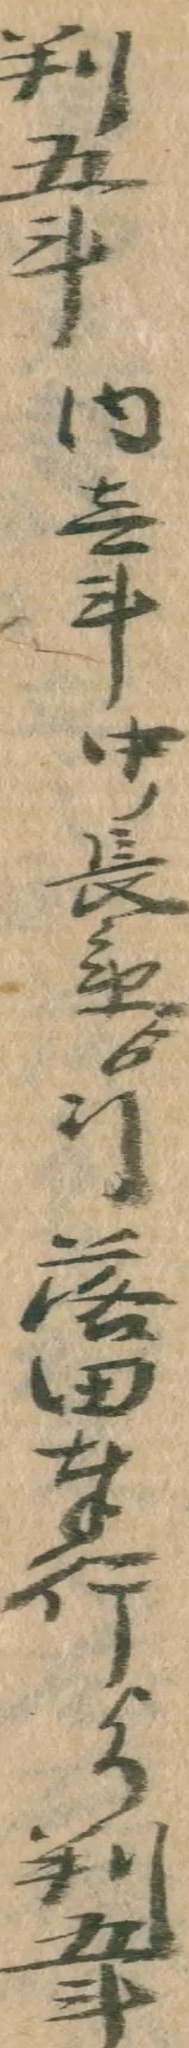判五斗内壱斗中ノ長兵衛ゟ引落田奉行より判五斗
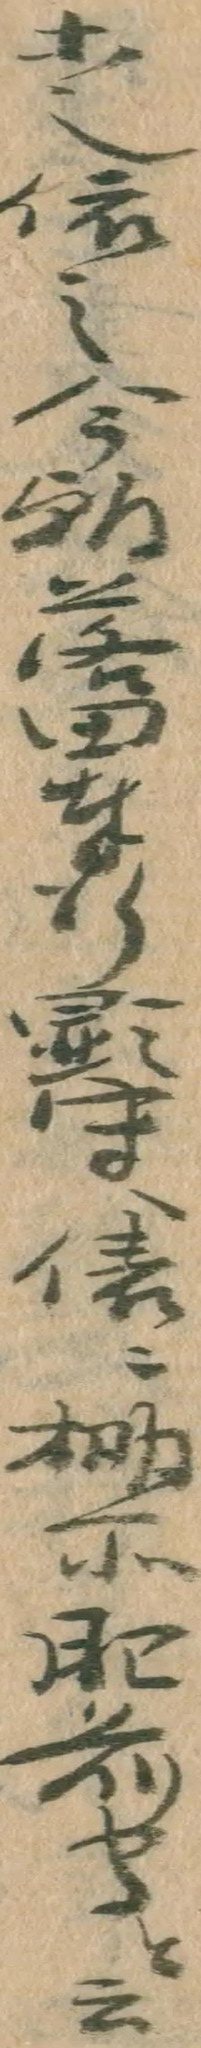等也依之今朝落田奉行顕彰守へ俵ニ棚所肥前守と云
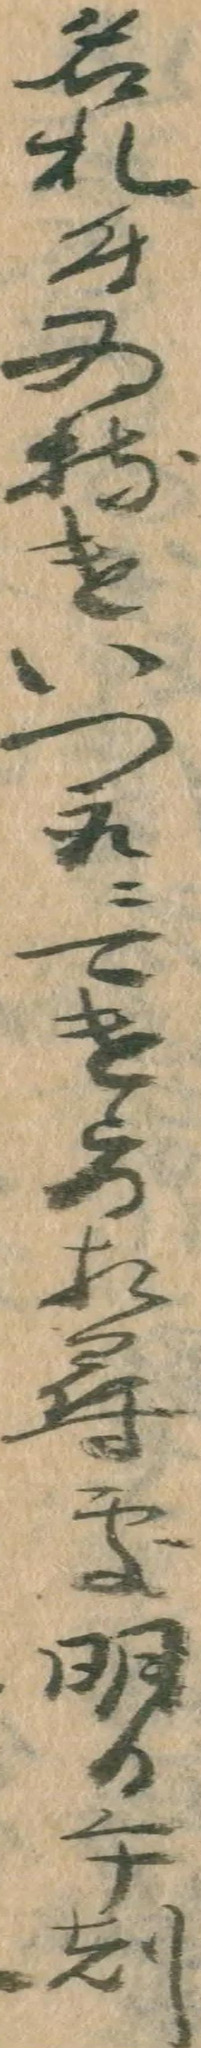名札付為持遣いつ取に可遣旨相尋處明日午刻
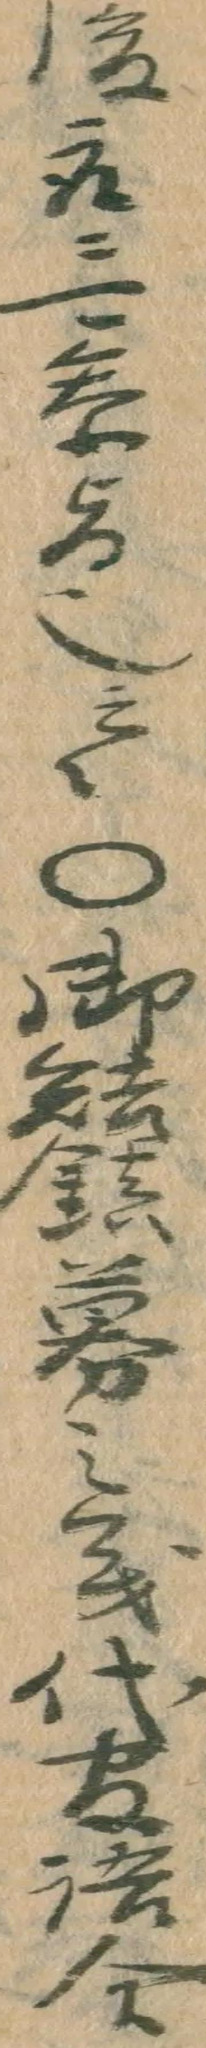後取に可参旨也云〻○御結鎮募之義代官談合
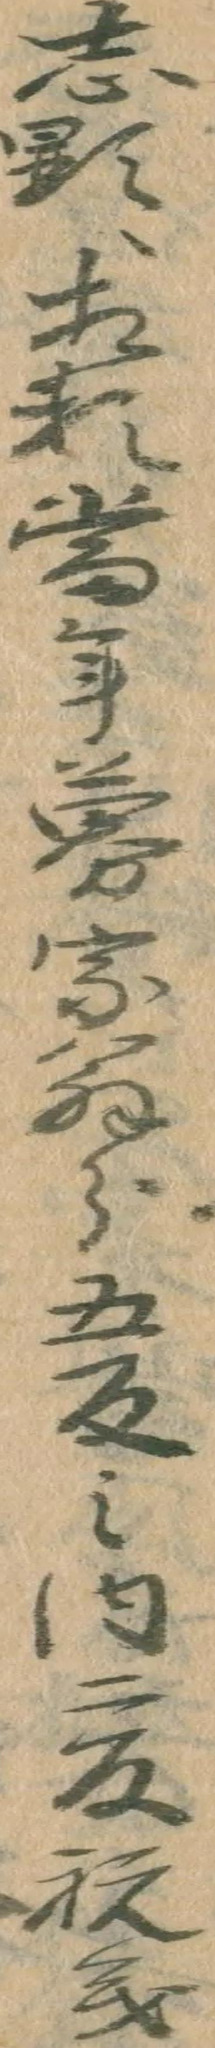志顕へ相頼當年募家翁分五反之内二反祝義
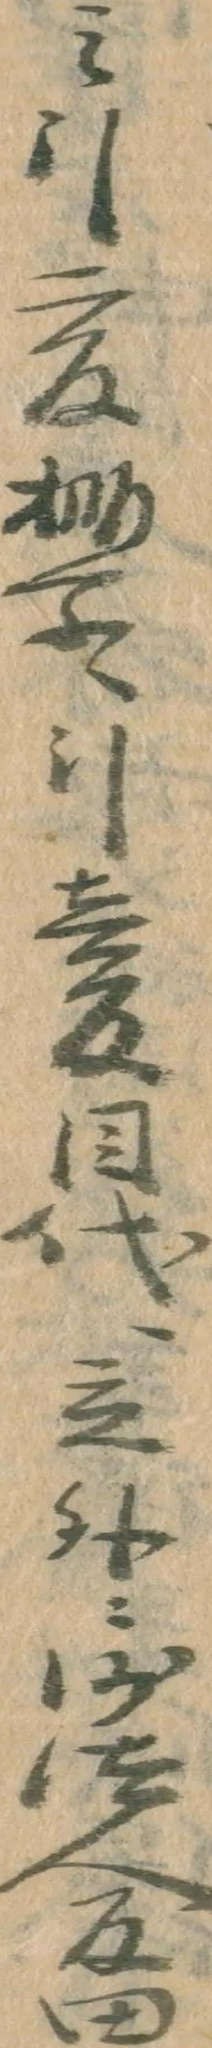之引二反棚所へ引壱反目代へ立外に沙汰人反田
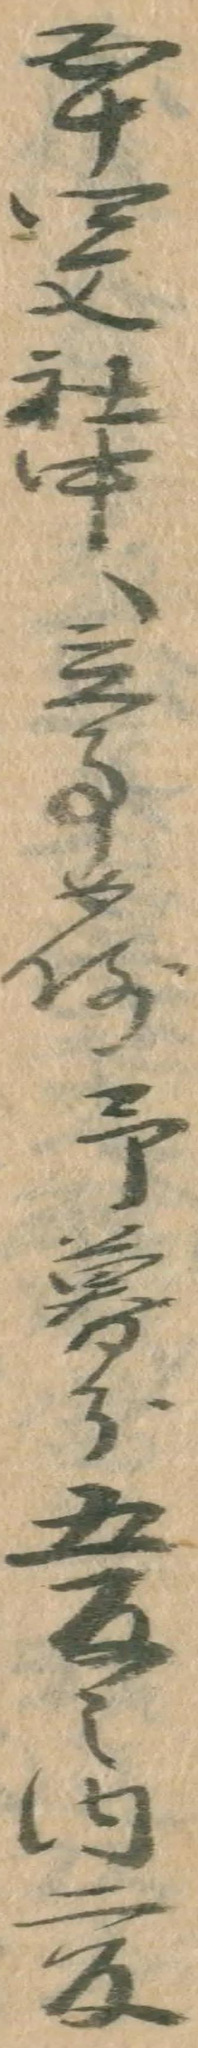五十四文社中へ立事如例予暮分五反之内二反
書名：賀茂社記録. 第63冊
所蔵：国立国会図書館 National Diet Library, JAPAN
